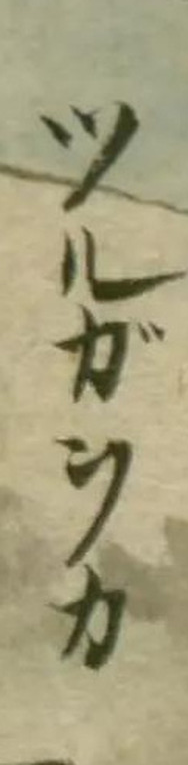ツルガヲカ
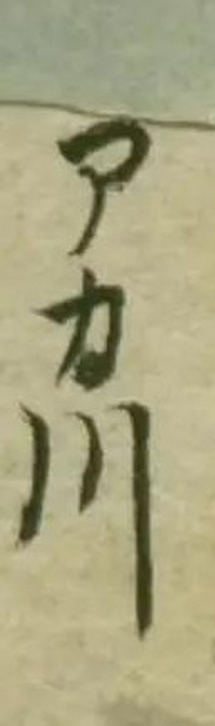アカ川
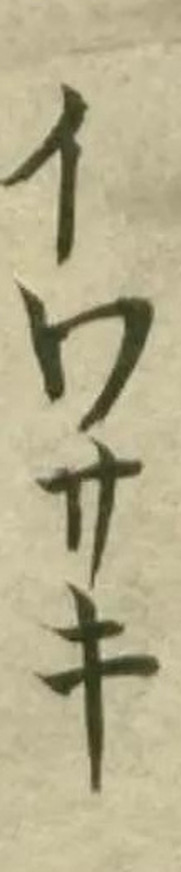イワサキ
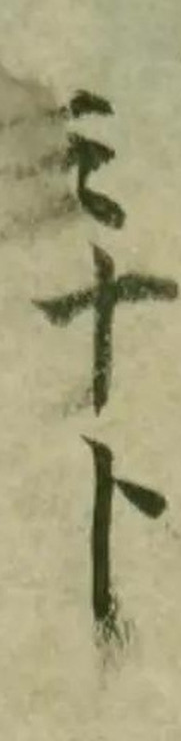ミナト
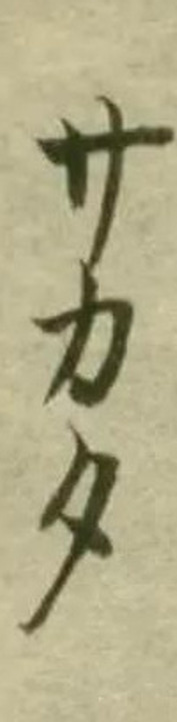サカタ
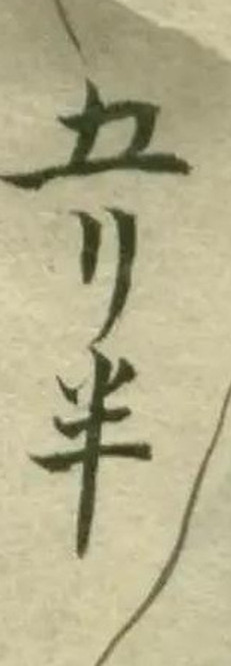五リ半
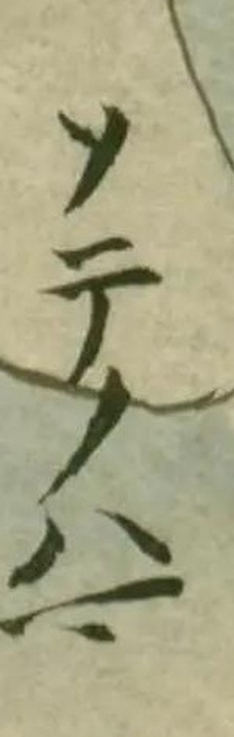ソテノハマ
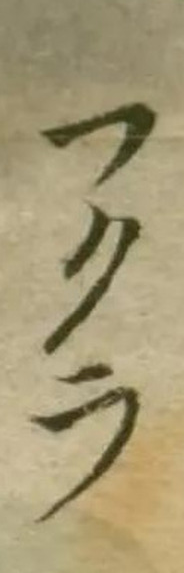フクラ
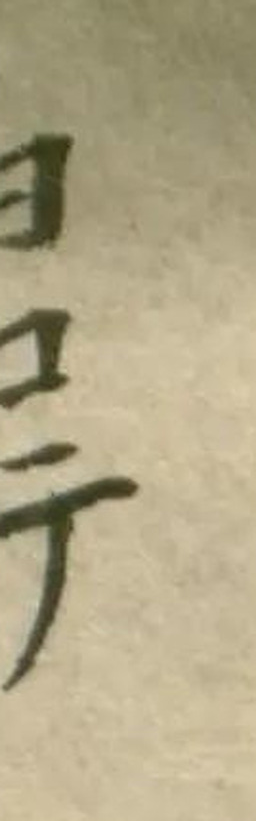ヨコテ

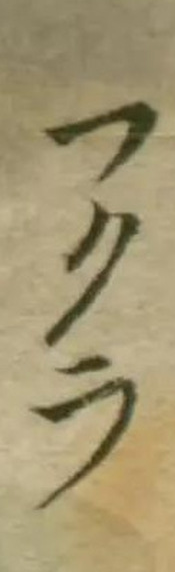フクラ
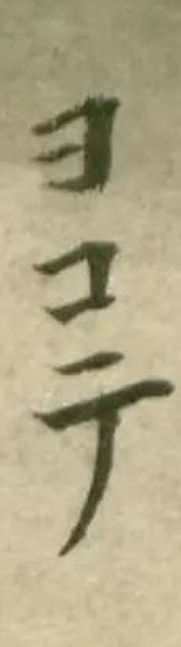ヨコテ
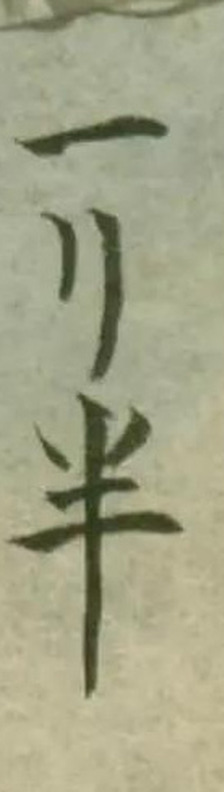一リ半
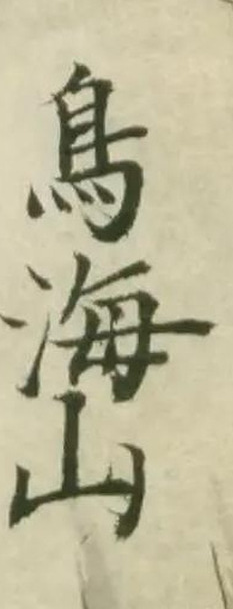鳥海山
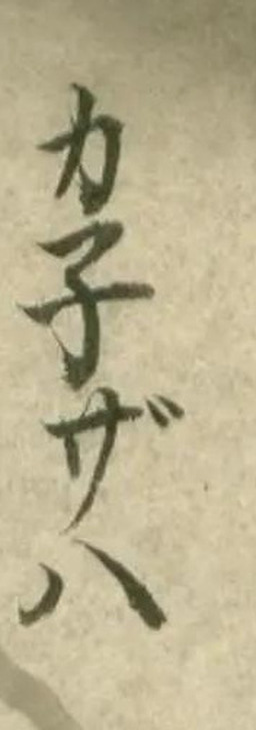カネザハ
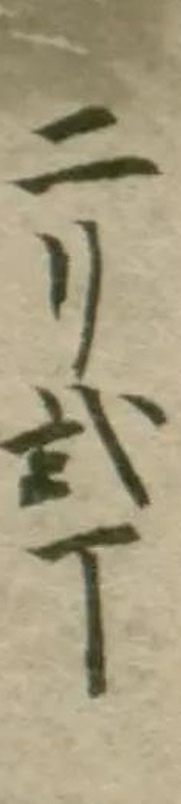二リ弐丁

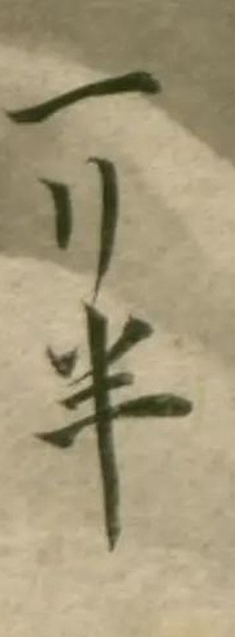一リ半
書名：江戸より奥州津輕迄道筋之圖
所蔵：国立国会図書館 National Diet Library, JAPAN
